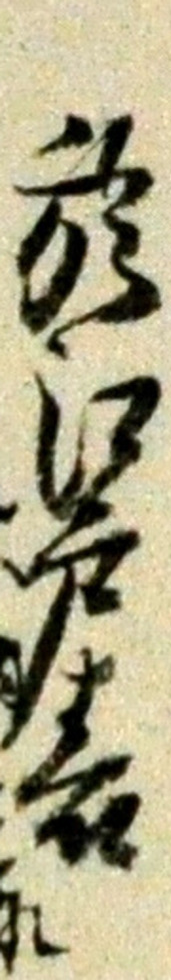於江戸表
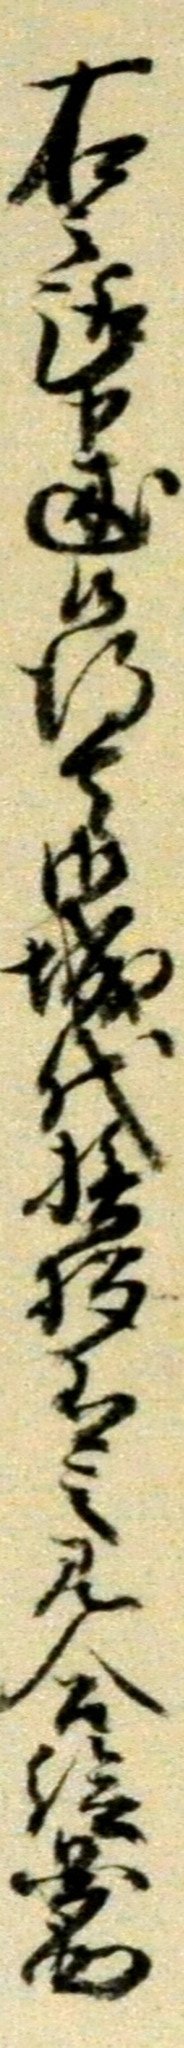右之趣申越候得者御城代挨拶有之見合給図面
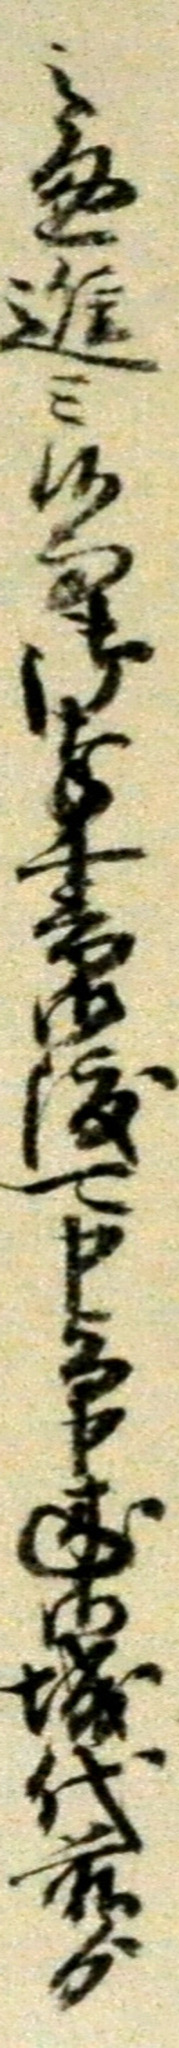之通進ミ候而御奉書御渡可申旨申述御城代前ゟ
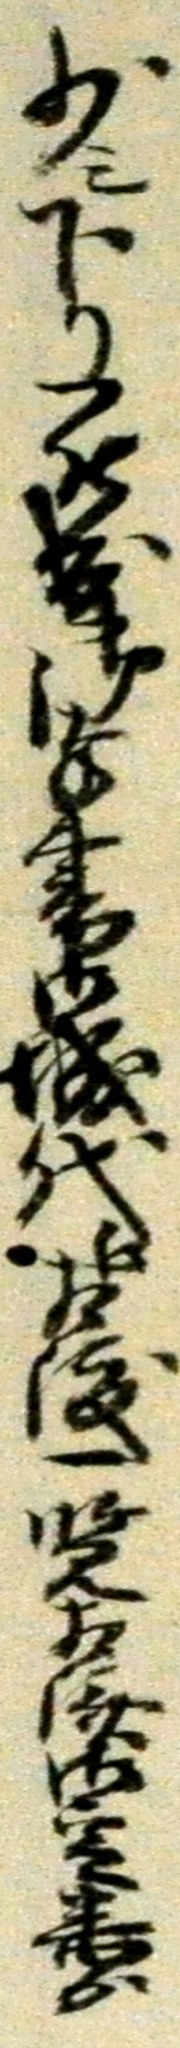少シ下り罷出御奉書御城代江相渡一覧相済御定番ゟ
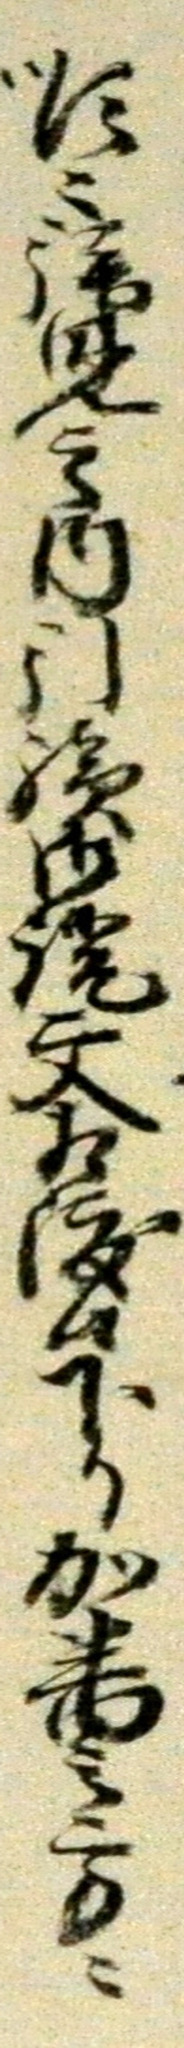順々拝見之内引續御證文相渡候下り加番之方ニ
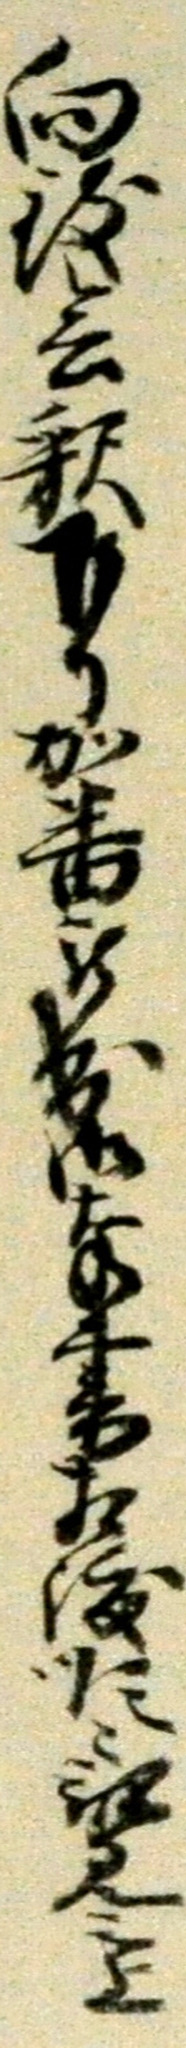向致会釈下り加番被出御奉書相渡順々被見之上
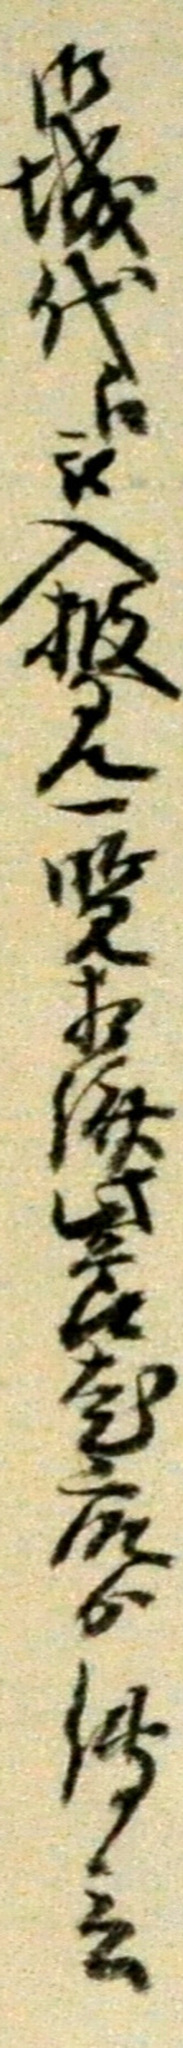御城代江被入披見一覧相済此節老衆ゟ伝言
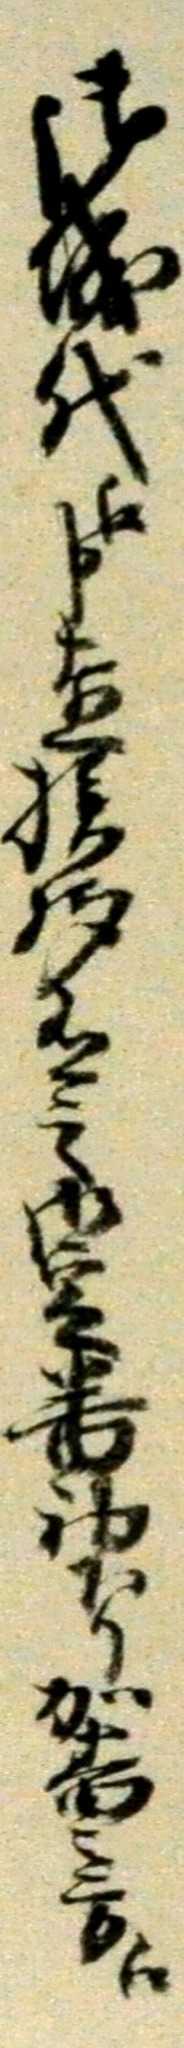御城代江申置挨拶有之御定番初下り加番之方江
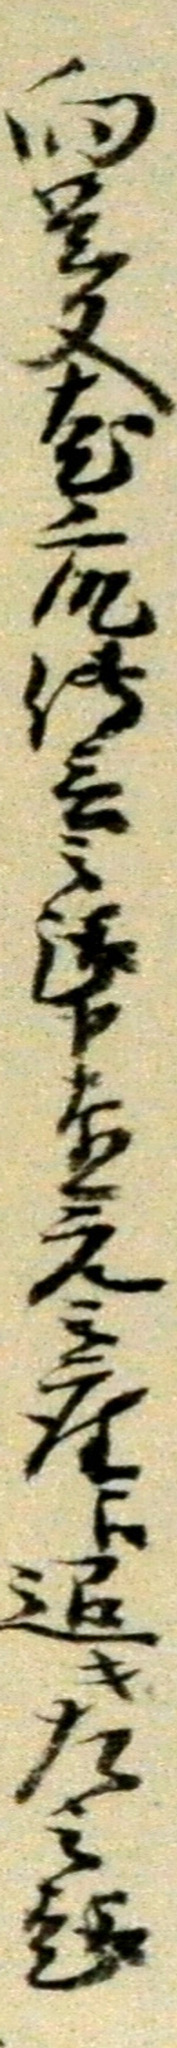向是又老衆伝言之趣申置元之座江退キ左之趣
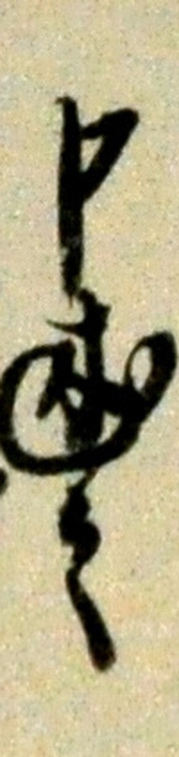申述之
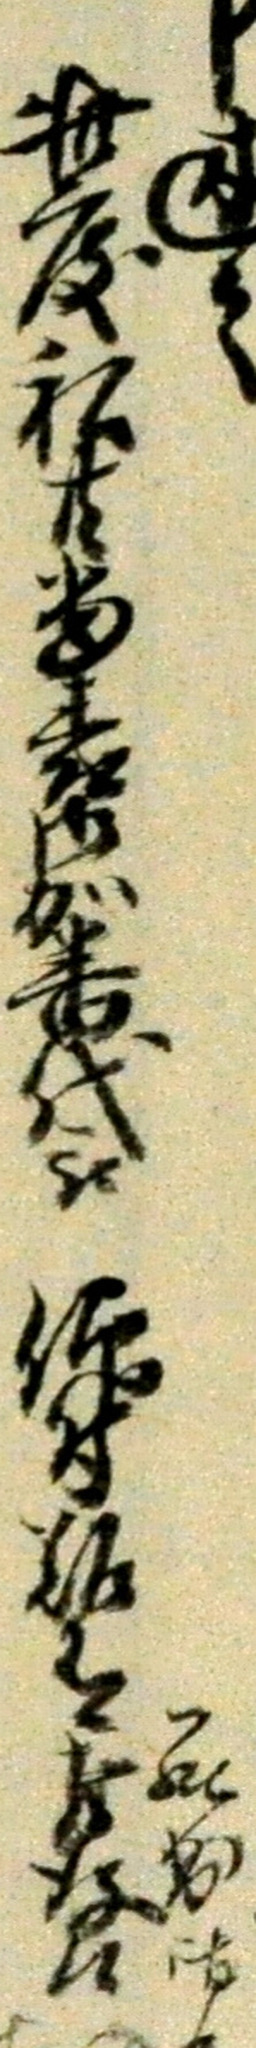此度私共当表御加番代被仰付難有奉存候
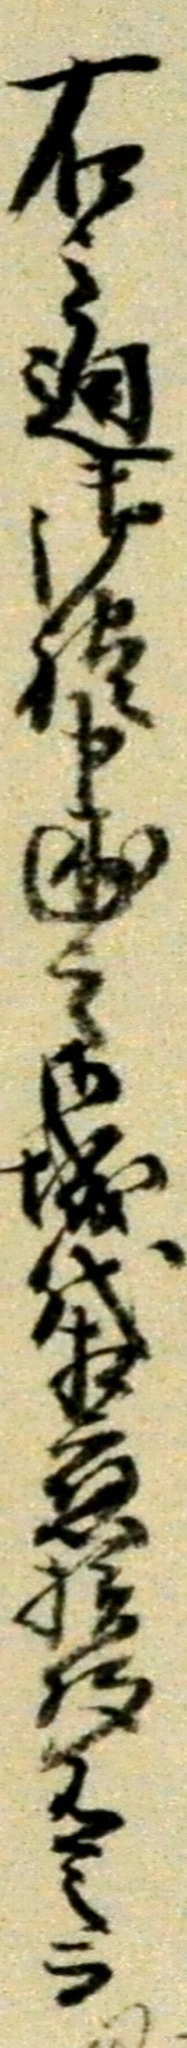右之通御禮申述之御城代相応挨拶有之テ
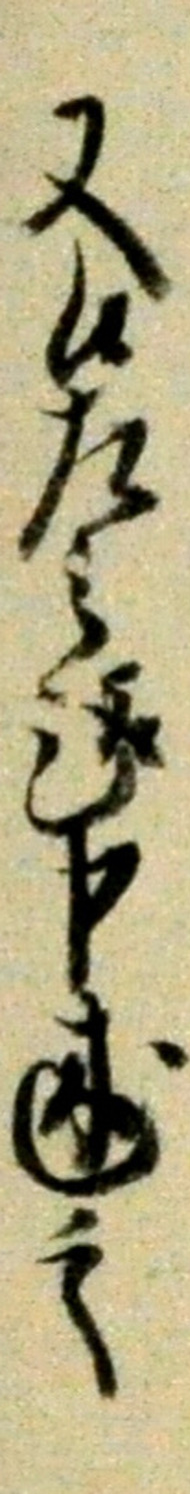又候左之趣申述之
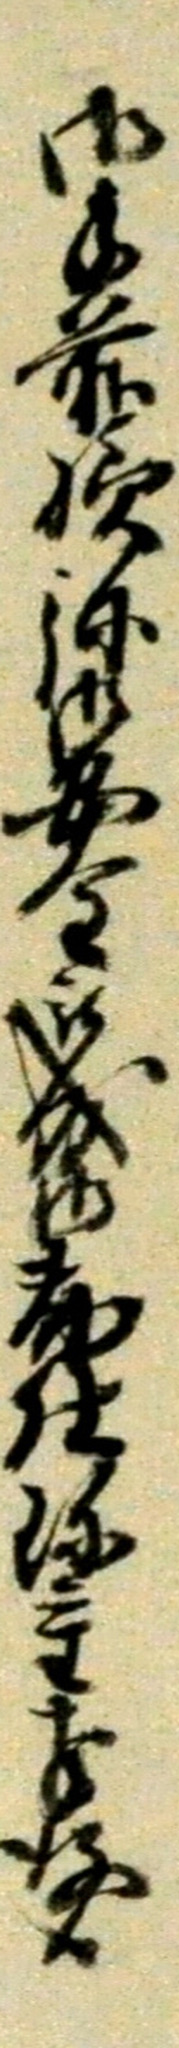御手前様弥御安全被成御座仕珍重奉存候
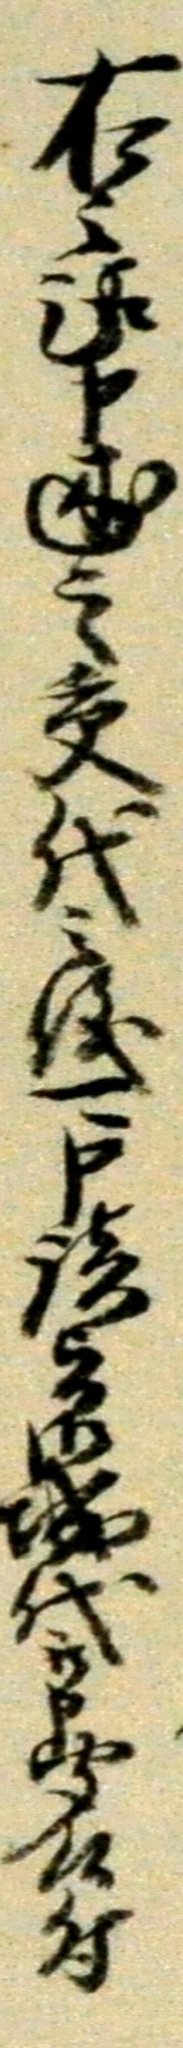右之趣申述之交代之儀可申談旨御城代被申聞候付
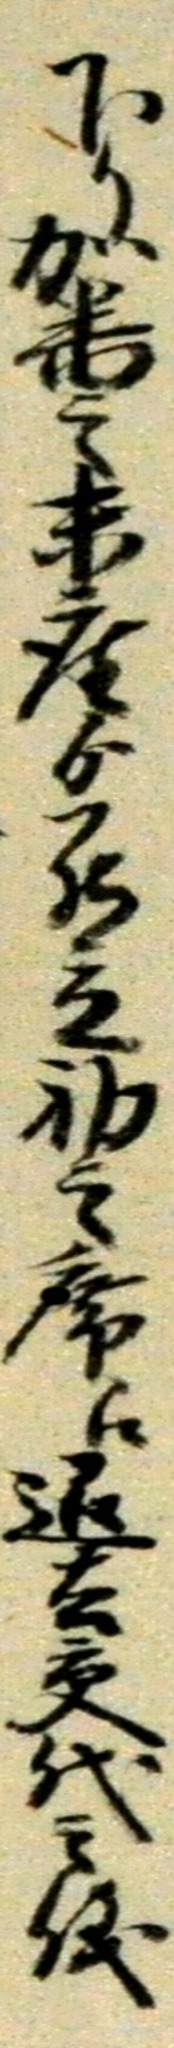下り加番之末座ゟ罷立初之席江退去交代之儀
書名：大阪加番関係諸書留〔一括〕
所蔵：伊那市立高遠町図書館・合同会社AMANE
